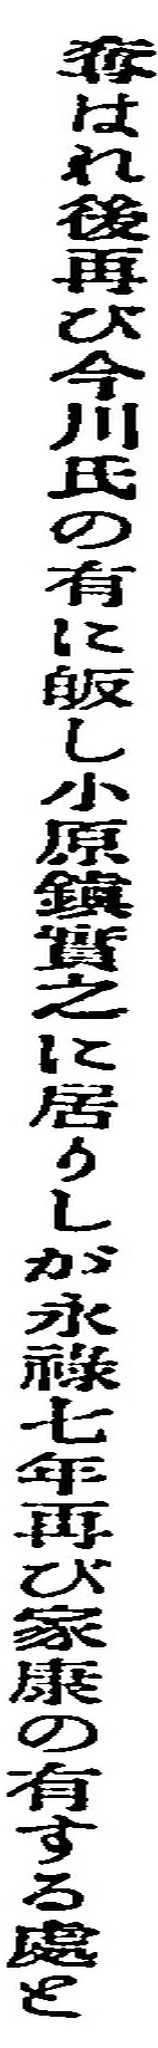奪はれ後再び今川氏の有に皈し小原鎭實之に居りしが永祿七年再び家康の有する處と
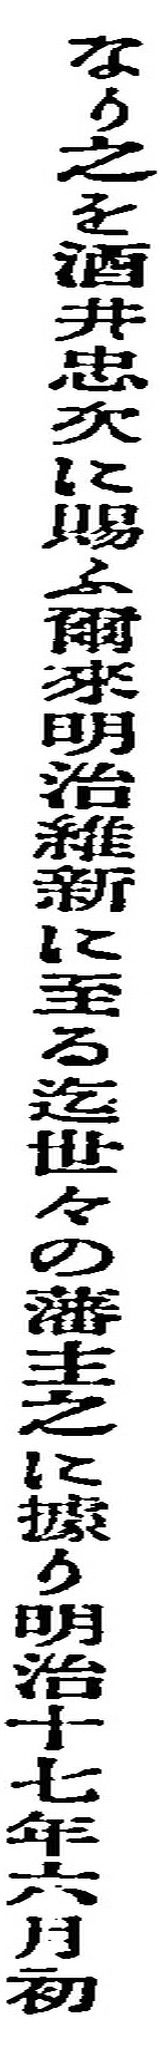なり之を酒井忠次に賜ふ爾來明治維新に至る迄世々の藩主之に據り明治十七年六月初
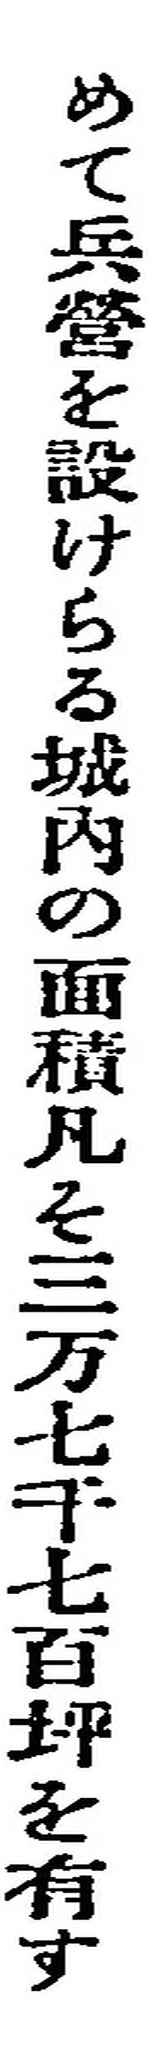めて兵營を設けらる城内の面積凡そ三万七千七百坪を有す
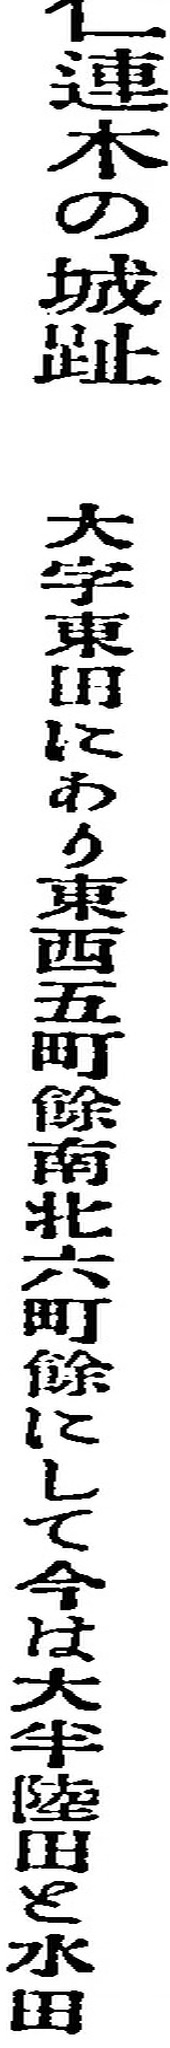仁連木の城趾大字東田にあり東西五町餘南北六町餘にして今は大半陸田と水田
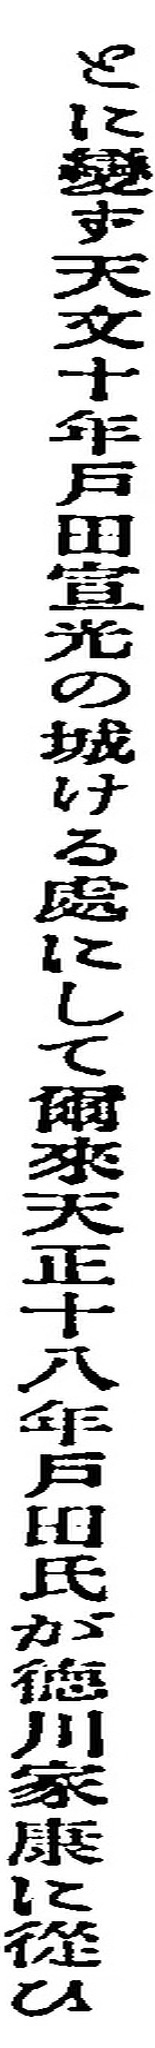とに變ず天文十年戸田宣光の城ける處にして爾來天正十八年戸田氏が德川家康に從ひ
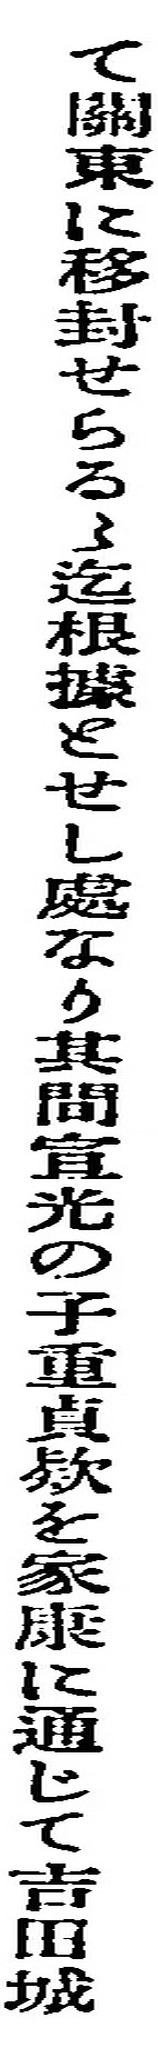て關東に移封せらるゝ迄根據とせし處なり其間宣光の子重貞欵を家康に通じて吉田城
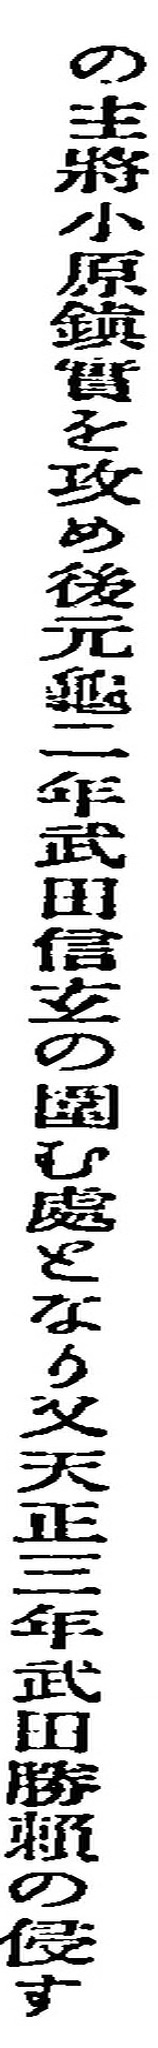の主將小原鎭實を攻め後元龜二年武田信玄の圍む處となり又天正三年武田勝賴の侵す
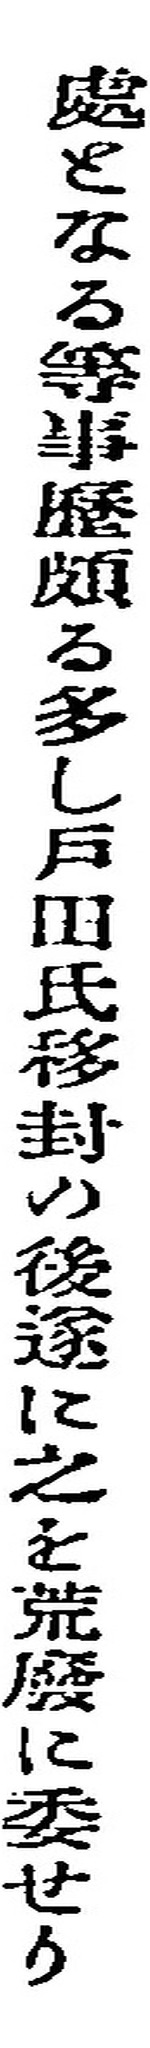處となる等事歷頗る多し戸田氏移封の後遂に之を荒廢に委せり
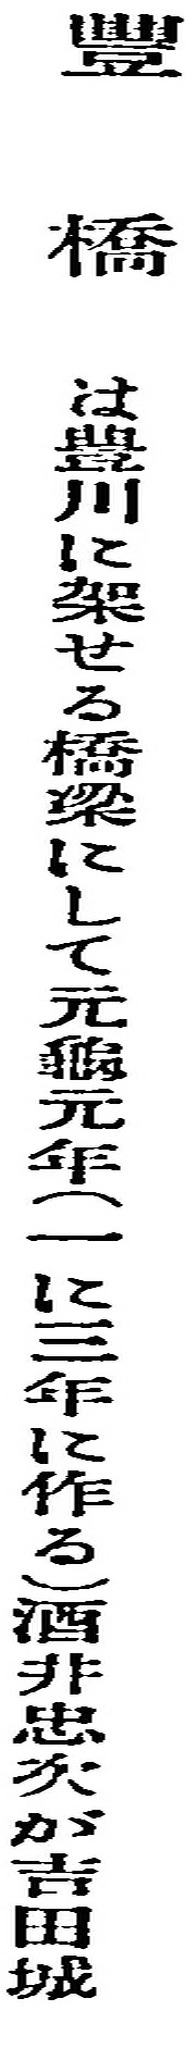豐橋は豊川に架せる橋梁にして元龜元年(一に三年に作る)酒井忠次が吉田城
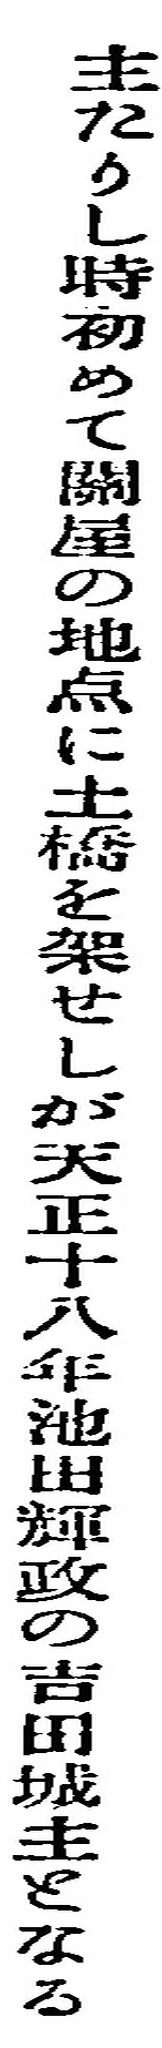主たりし時初めて關屋の地点に土橋を架せしが天正十八年池田輝政の吉田城主となる
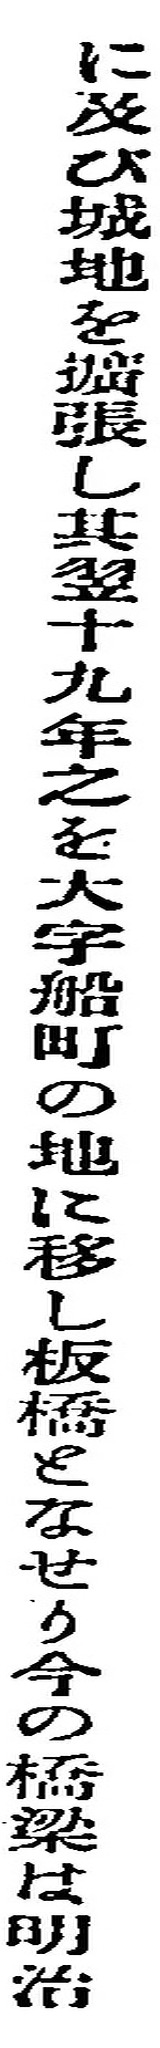に及び城地を擴張し其翌十九年之を大字船町の地に移し板橋となせり今の橋梁は明治
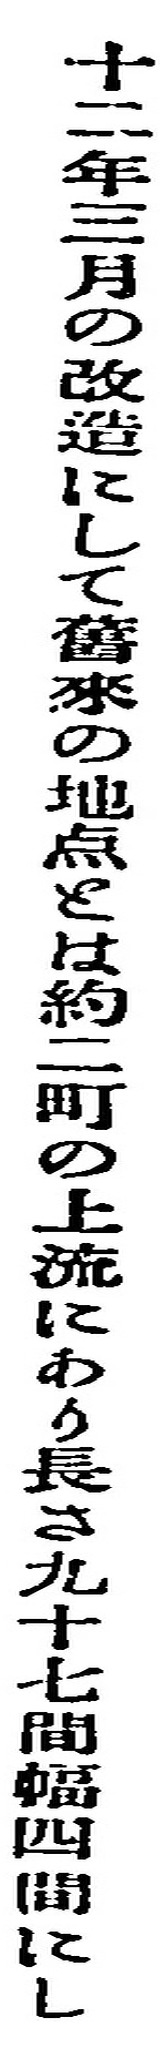十二年三月の改造にして舊來の地点とは約二町の上流にあり長さ九十七間幅四間にし
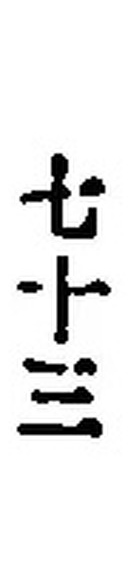七十三

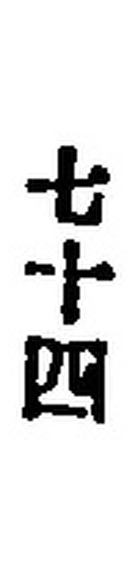七十四
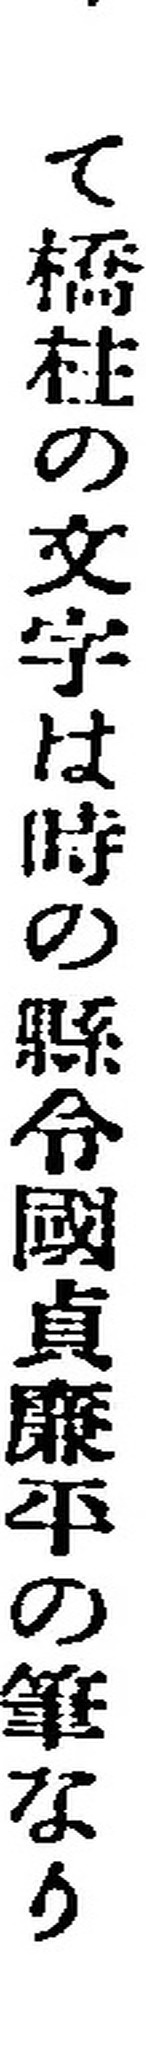て橋柱の文字は時の縣令國貞廉平の筆なり
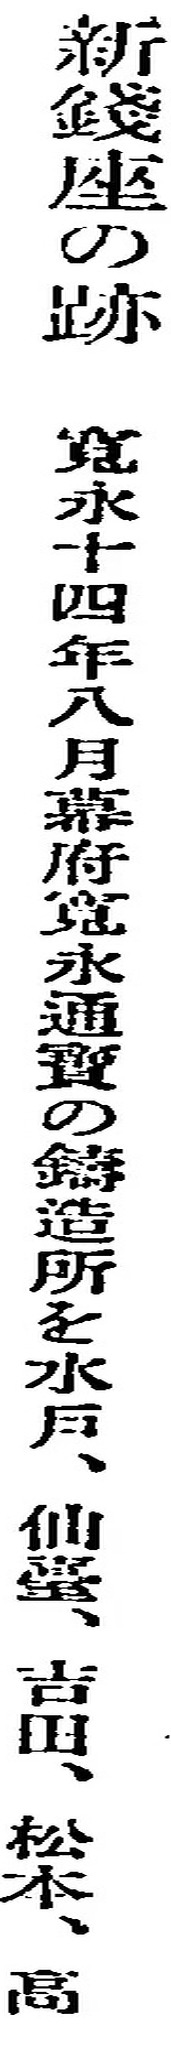新錢座の跡寛永十四年八月幕府寛永通寶の鑄造所を水戸、仙臺、吉田、松本、高
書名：豊橋志要
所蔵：国立国会図書館 National Diet Library, JAPAN
